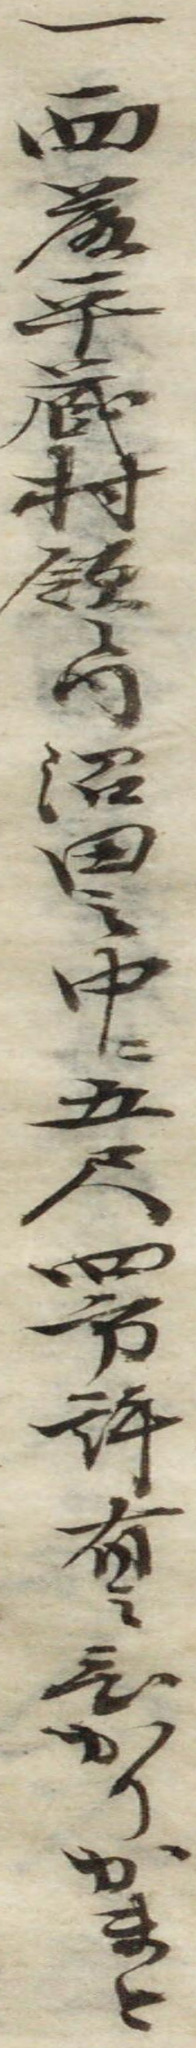一西藤平蔵村領之内沼田之中に五尺四方許有之ひかりかまと
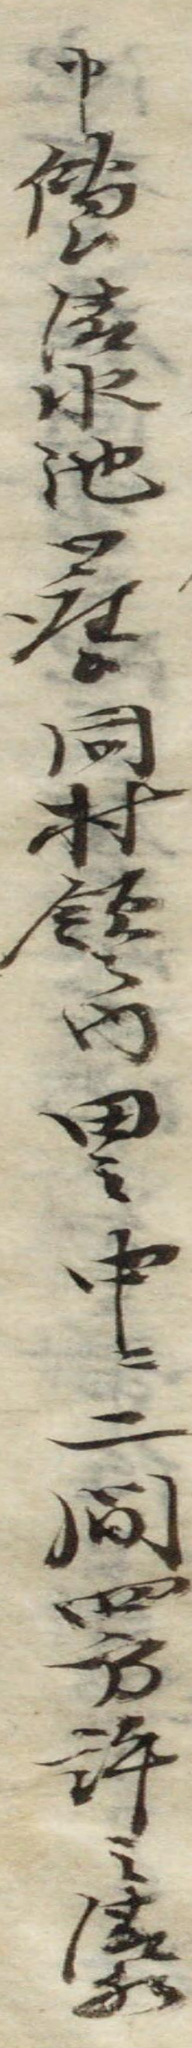申伝候清水池御座候同村領之内田之中に二間四方許之清水

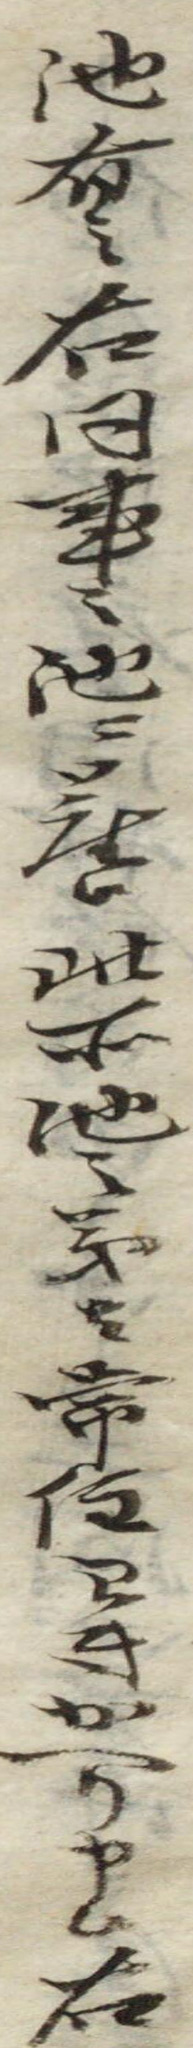池有之右同事之池に御座候此所池之義は常住わきかえり申候右
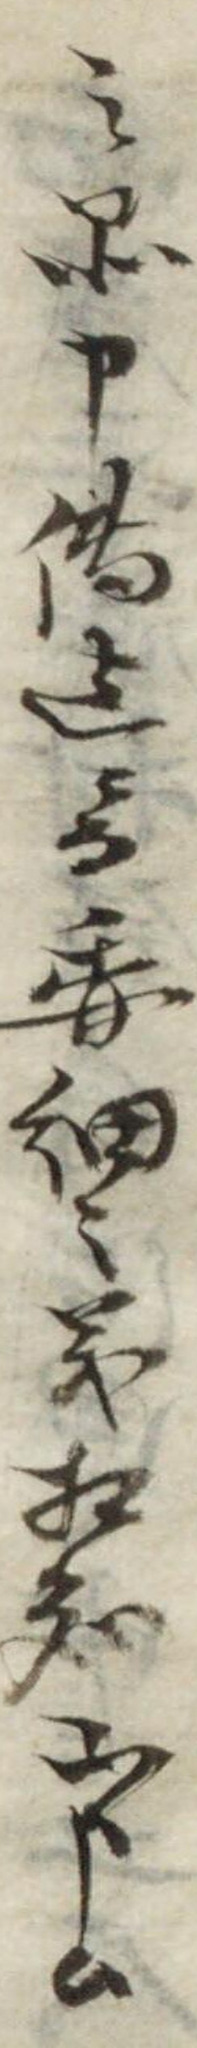之品申伝迄に而委細之義相知不申候
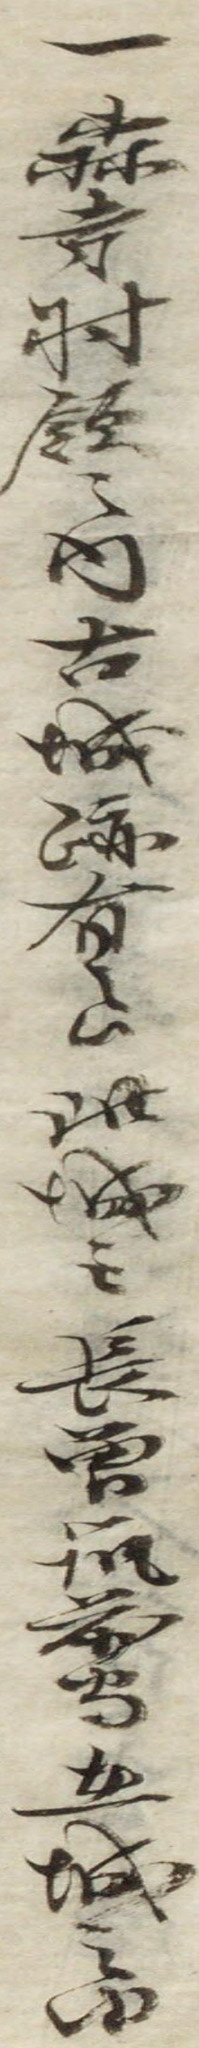一森寺村領之内古城跡有之候此城主長曽筑前守在城之由
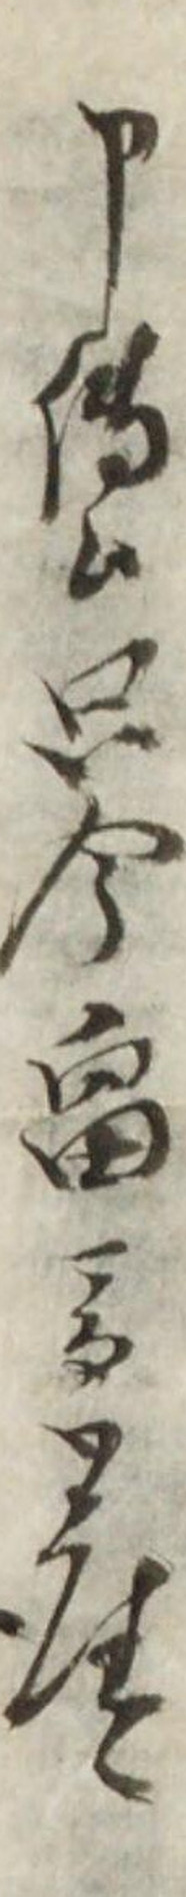申伝候只今畠に而御座候
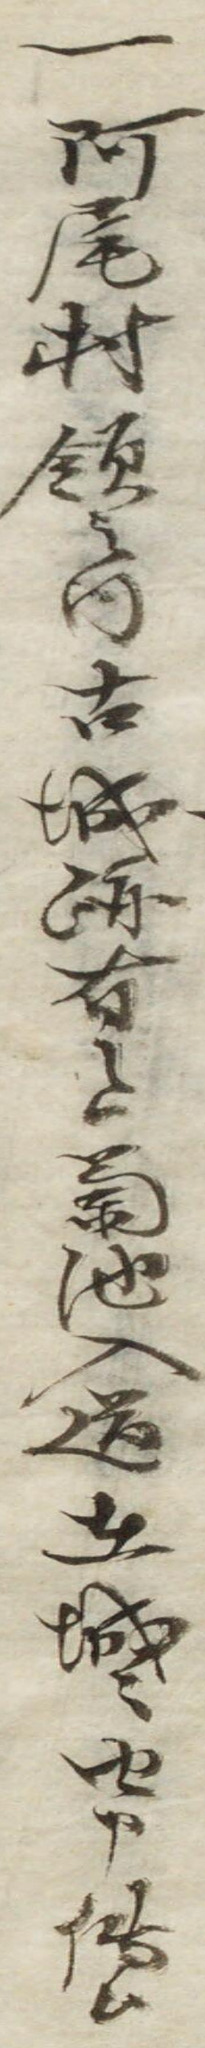一阿尾村領之内古城跡有之候菊池入道在城之由申伝候
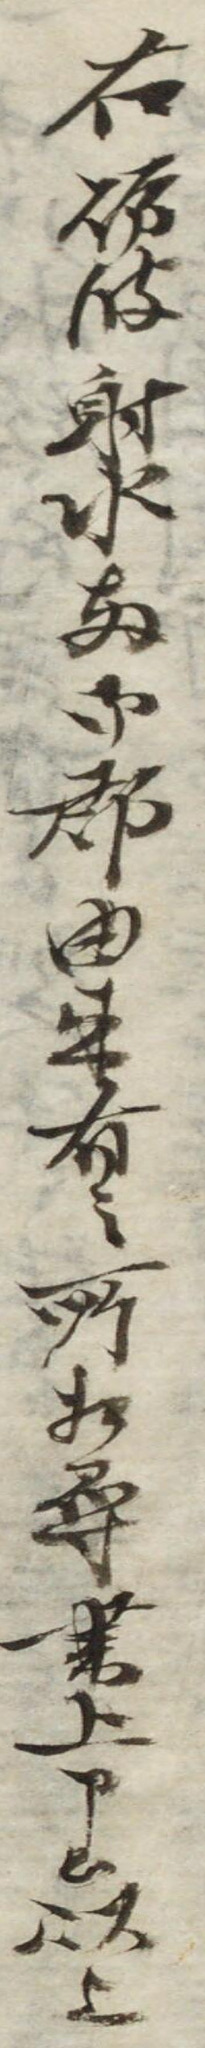右砺波射水両御郡由来有之処相尋書上申候以上
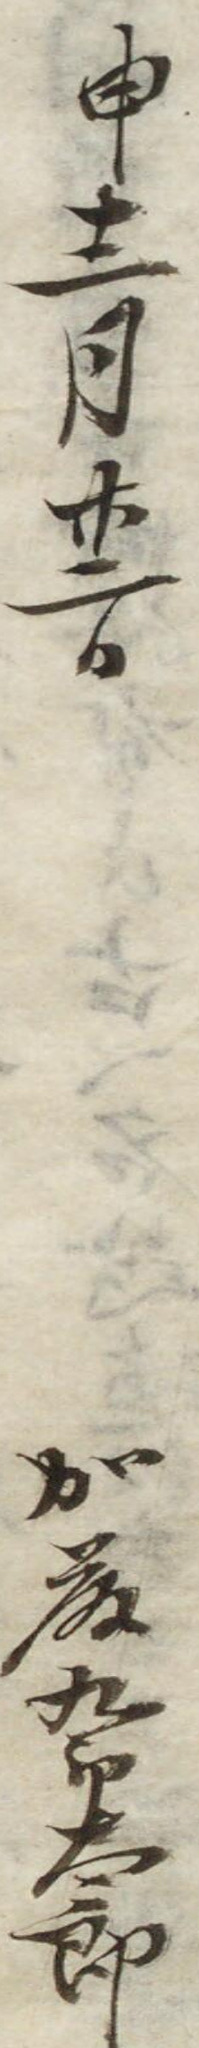申十二月廿二日加藤九郎太郎
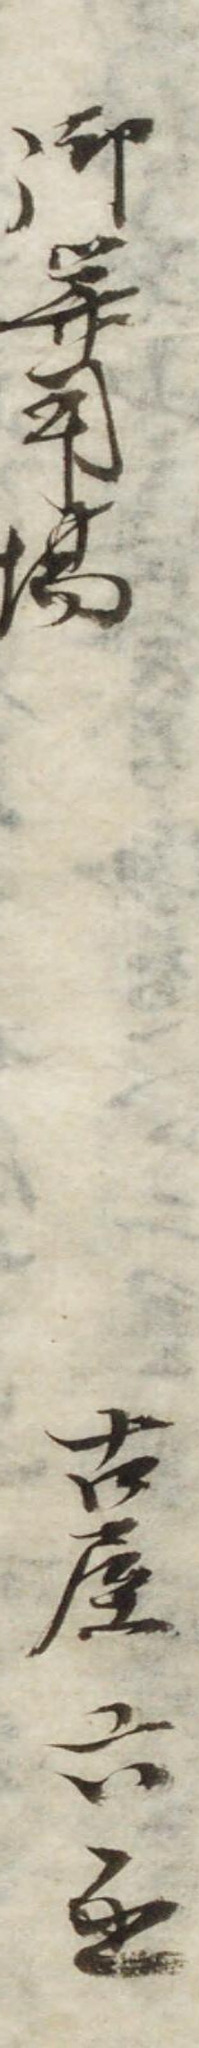御算用場古屋六丞
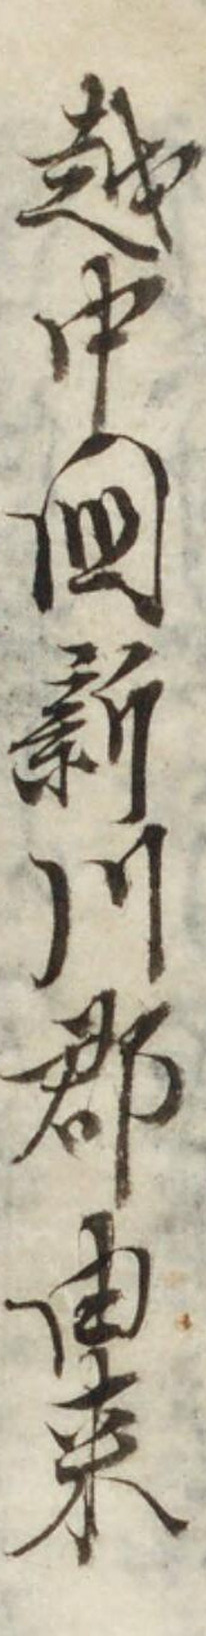越中国新川郡由来
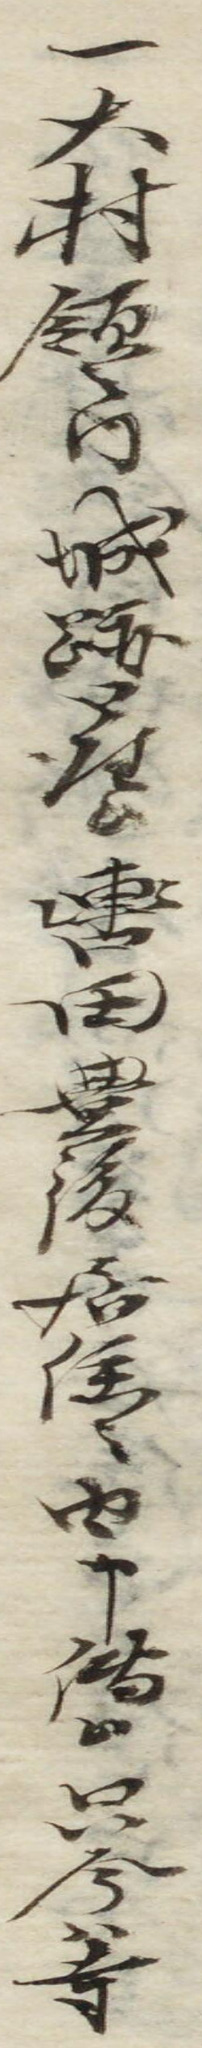一大村領之内城跡御座候轡田豊後居住之由申伝候只今は寺
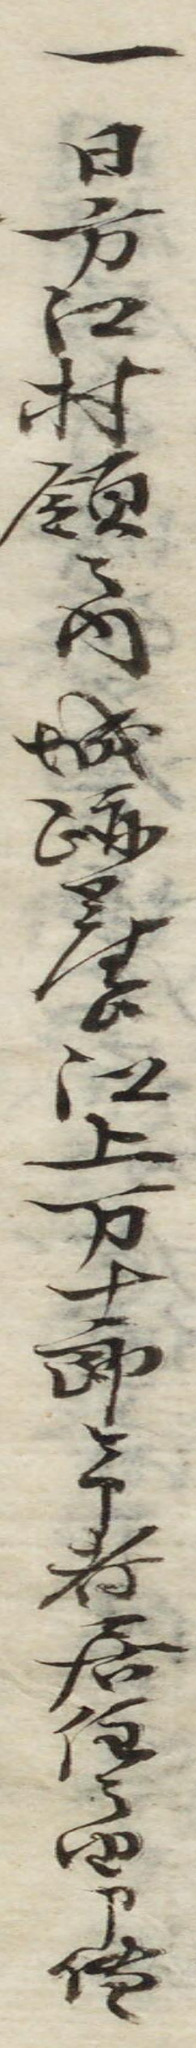一日方江村領之内城跡御座候江上万十郎と申者居住之由申伝候
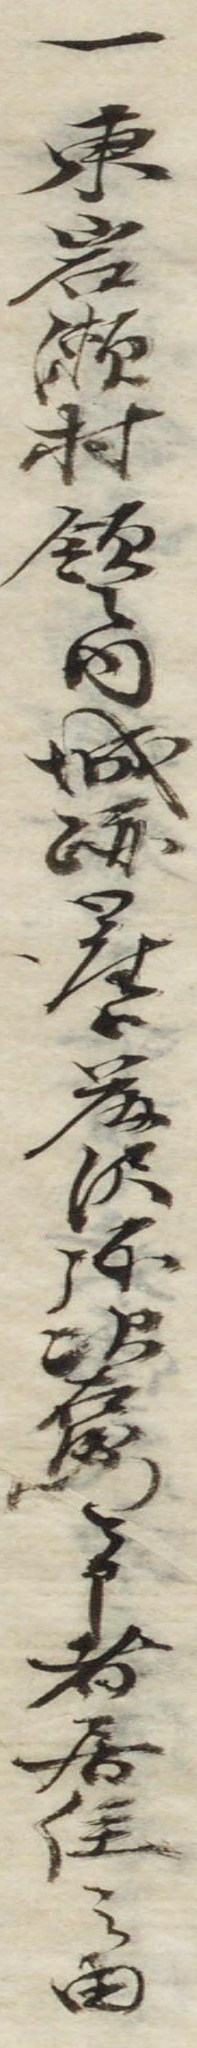一東岩瀬村領之内城跡御座候藤沢弥次右衛門と申者居住之由
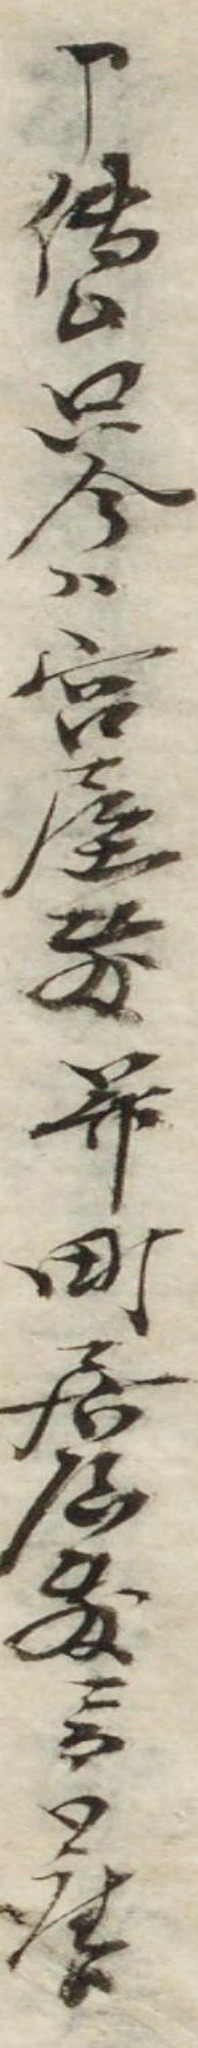申伝候只今は宮屋敷并町居屋敷に而御座候
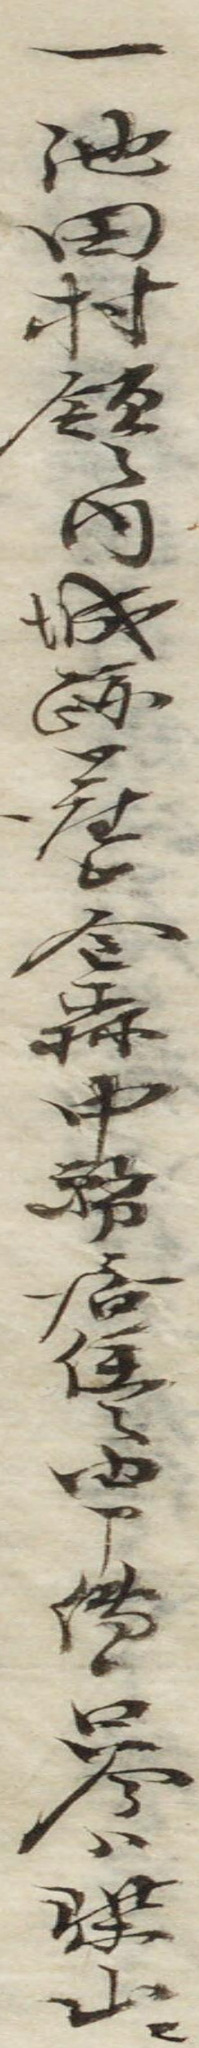一池田村領之内城跡御座候金森中務居住之由申伝候只今は柴山に
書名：加越能旧聞録
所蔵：Ishikawa Prefectural Library
